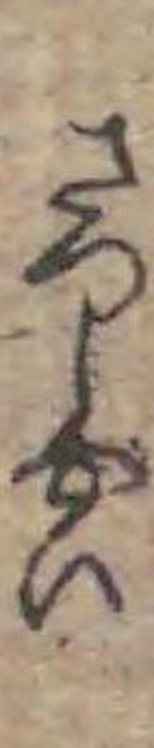さつしやい
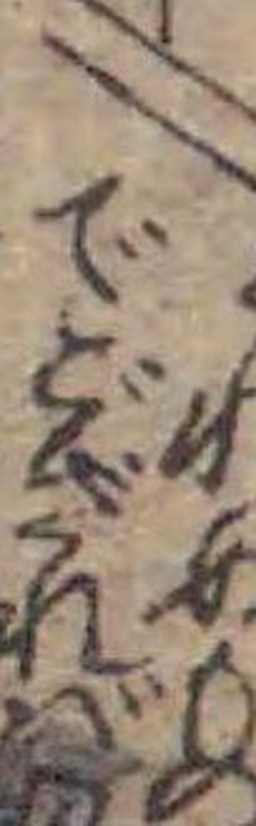でござれば
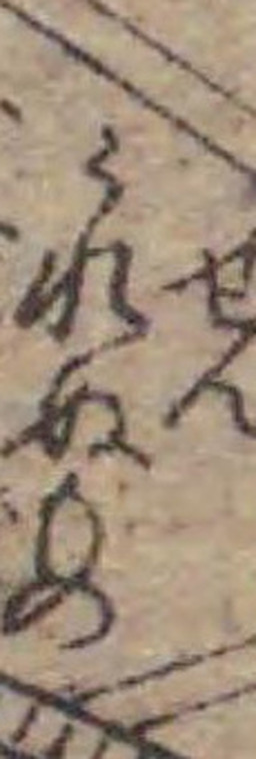うれぬもの
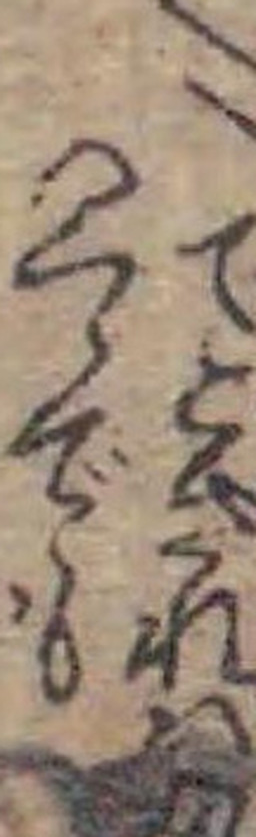いくらでも
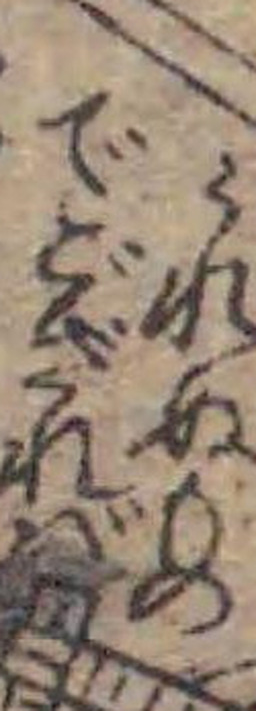でござれば
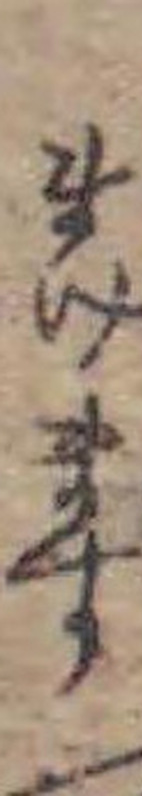まけます

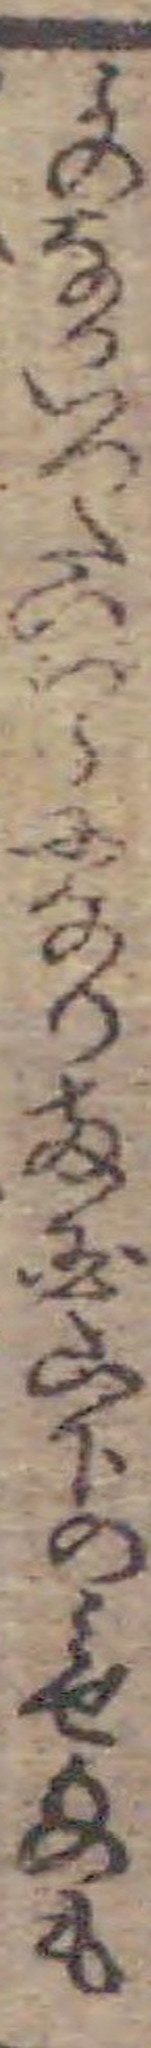よのなかいつたいつうになり両国山下のみせものも
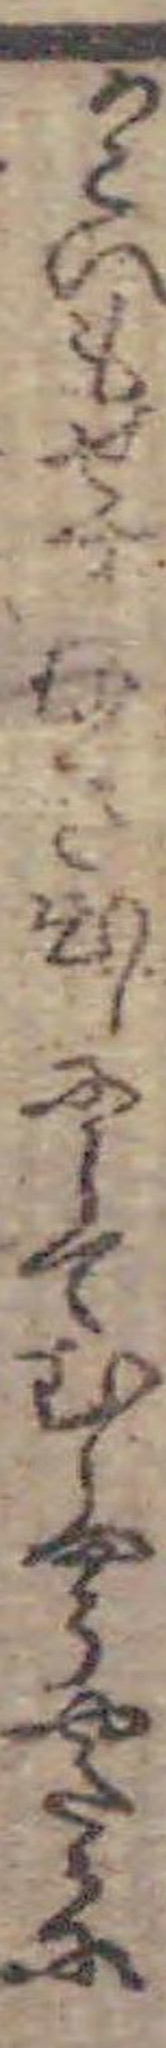かこいもせずむき出しにしてむしやうやたらに
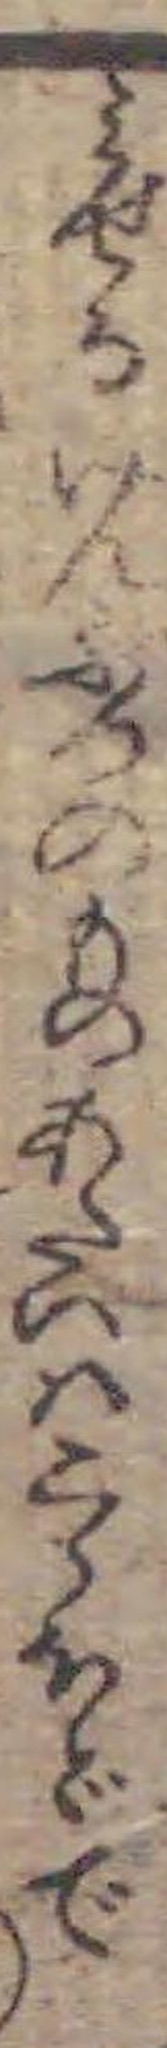みせるけんぶつのものあたいはこらほどで
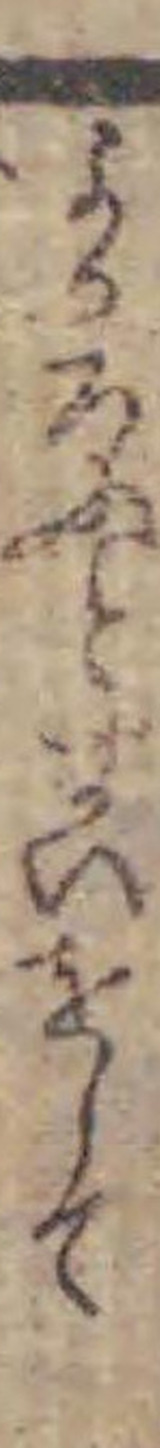よかろふとすいをして
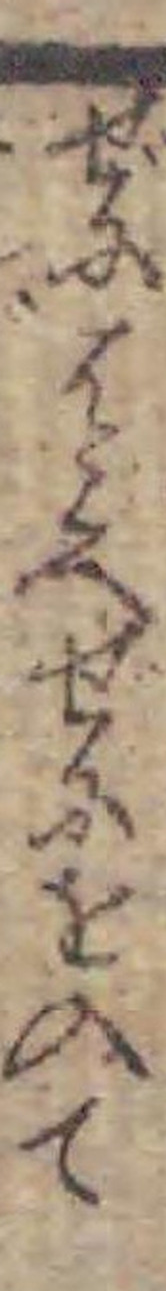ぜにはこへぜにを入て
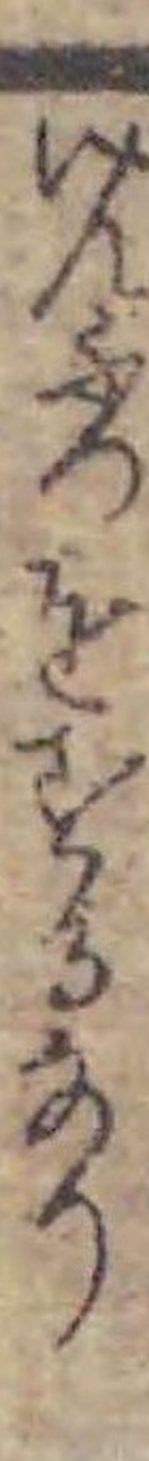けんぶつをするなり
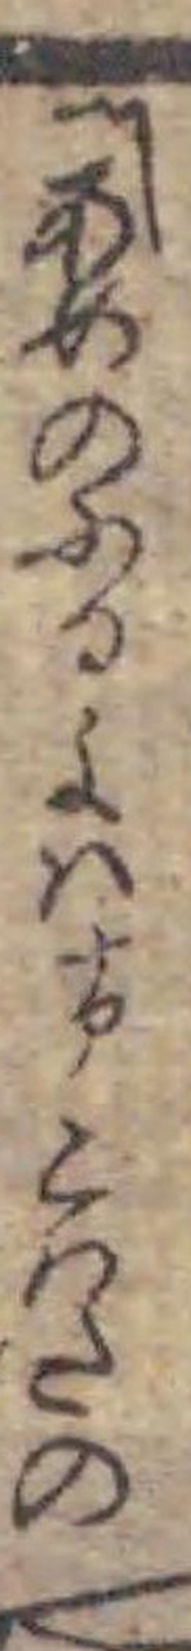〽あめのふるよはナアこはたの
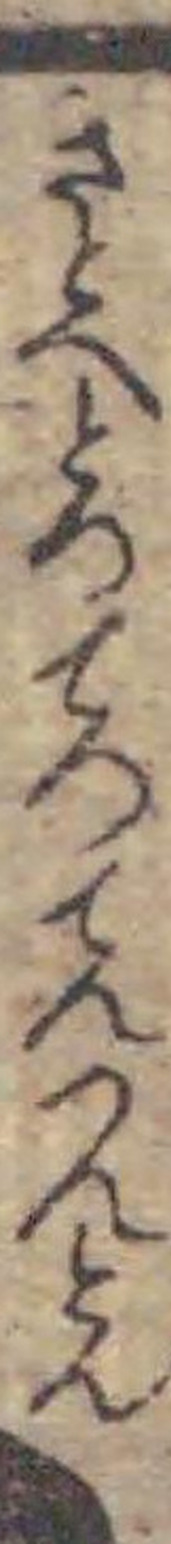きとへとつてつてんつんとん
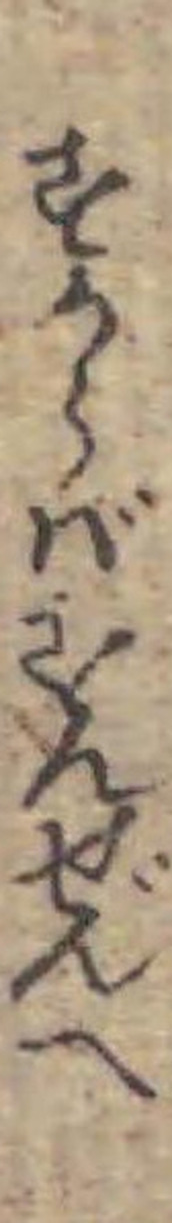すからばすんぜんへ
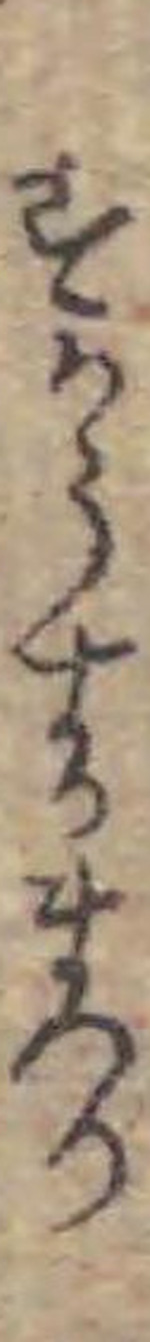すかうすかまつり
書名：威気千代牟物語 : 2巻
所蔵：国立国会図書館 National Diet Library, JAPAN
